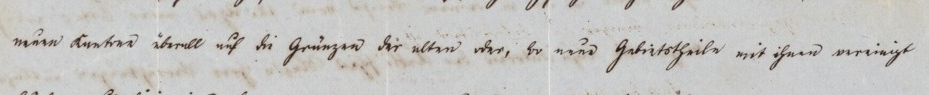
neuen Kantone überall auf die Gränzen der alten oder, wo neue Gebietstheile mit ihnen vereinigt
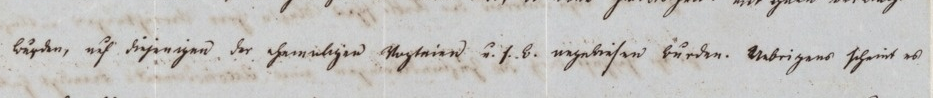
wurden, auf diejenigen der ehemaligen Vogteien u. s. w. angewiesen wurden. Uebrigens scheint es
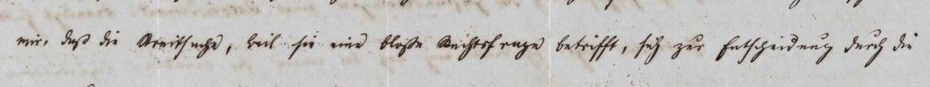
mir, daß die Streitsache, weil sie eine bloße Rechtsfrage betrifft, sich zur Entscheidung durch die
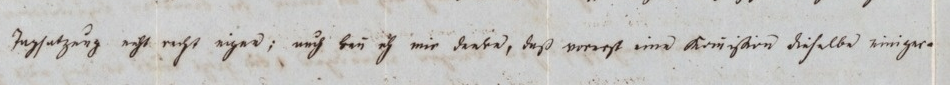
Tagsatzung nicht recht eigne; auch wenn ich mir denke, daß vorerst eine Kommission dieselbe einiger-
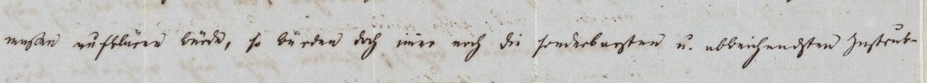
maßen aufklären würde, so würden doch immer noch die sonderbarsten u. abweichendsten Instruk-
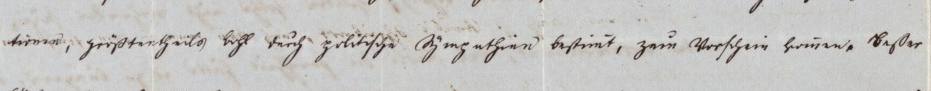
tionen, größtentheils wohl durch politische Sympathien bestimmt, zum Vorschein kommen. Besser
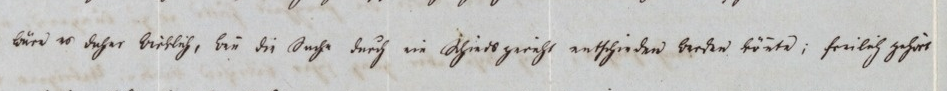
wäre es daher wirklich, wenn die Sache durch ein Schiedsgericht entschieden werden könnte; freilich gehört
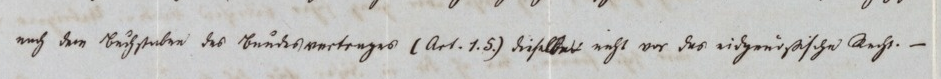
nach dem Buchstaben des Bundesvertrages (Art. 1.5.) dieselbe nicht vor das eidgenössische Recht. –
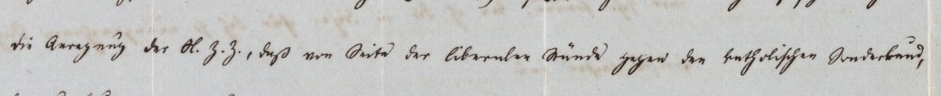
Die Anregung der N.Z.Z., daß von Seite der liberalen Stände gegen den katholischen Sonderbund,
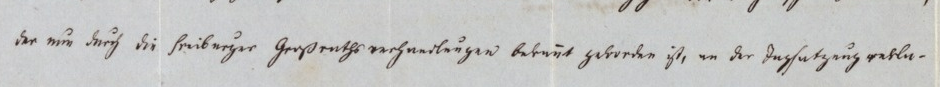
der nun durch die Freiburger Großrathsverhandlungen bekannt geworden ist, an der Tagsatzung rekla-
